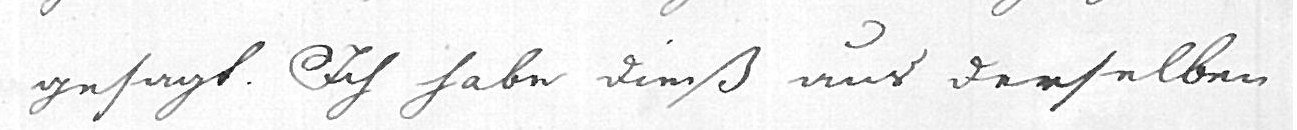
gesagt. Ich habe dieß aus derselben
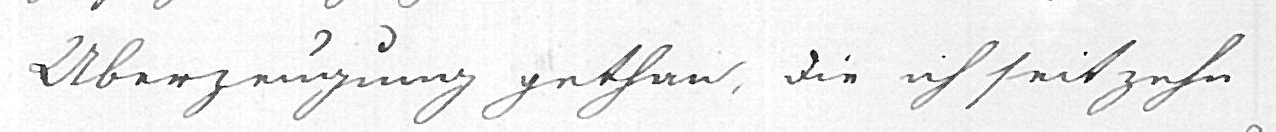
Uberzeugung gethan, die ich seit zehn
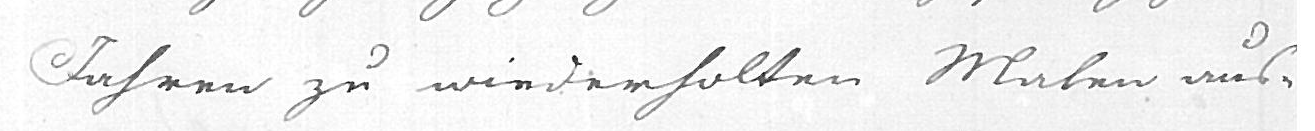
Jahren zu wiederholten Malen aus-
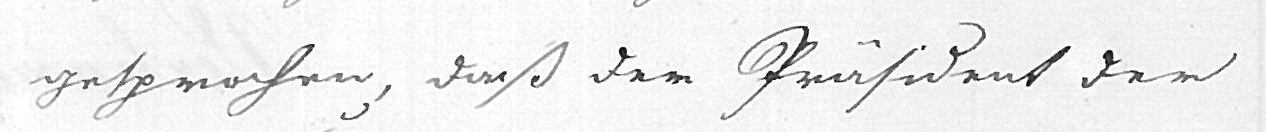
gesprochen, daß der Präsident der
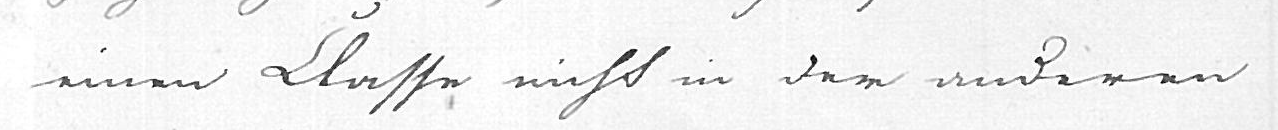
einen Classe nicht in der anderen
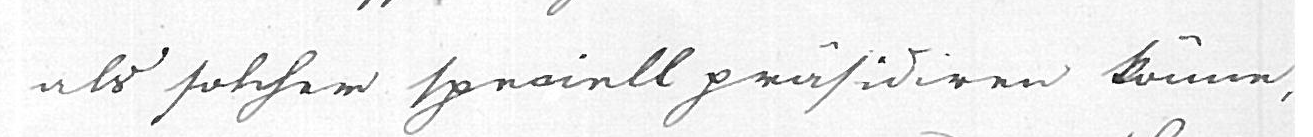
als solcher speziell präsidiren könne,
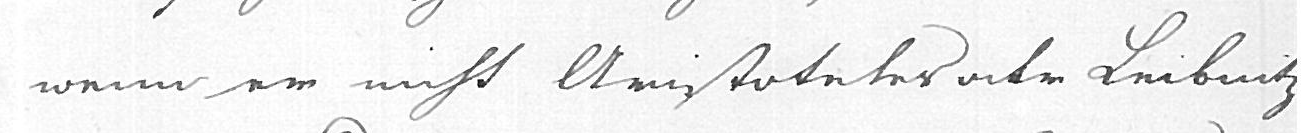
wenn er nicht Aristoteles oder Leibnitz
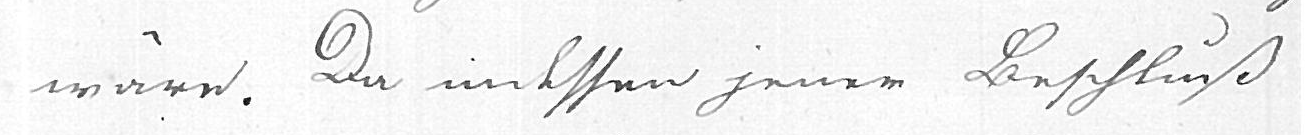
wäre. Da indessen jener Beschluß
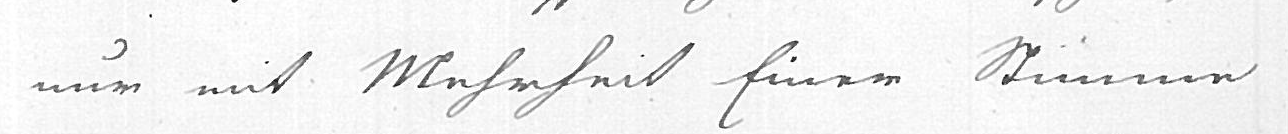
nur mit Mehrheit Einer Stimme
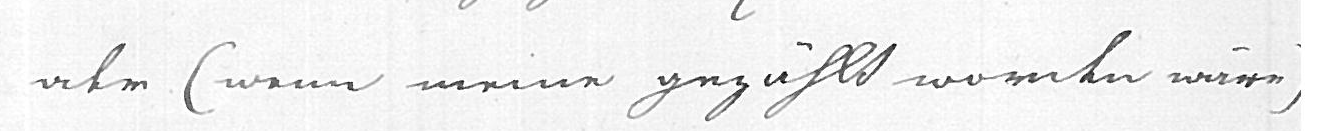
aber (wenn meine gezählt worden wäre)
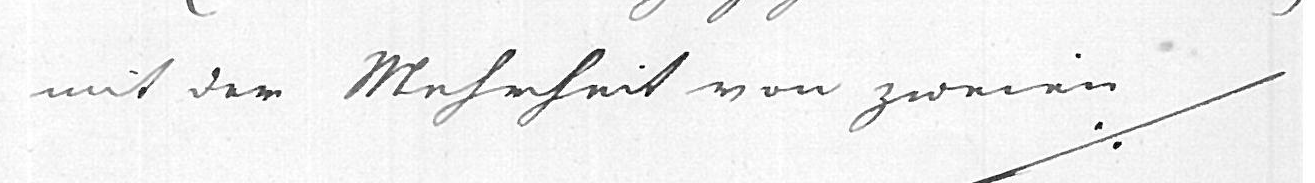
mit der Mehrheit von zweien
